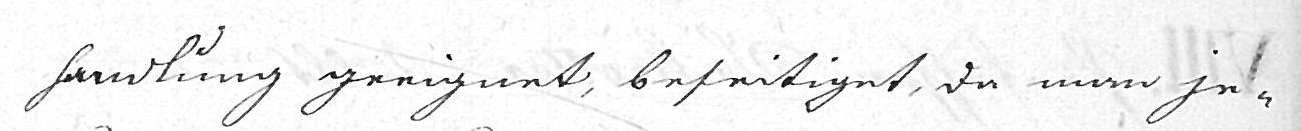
handlung geeignet, beseitiget, da man je-
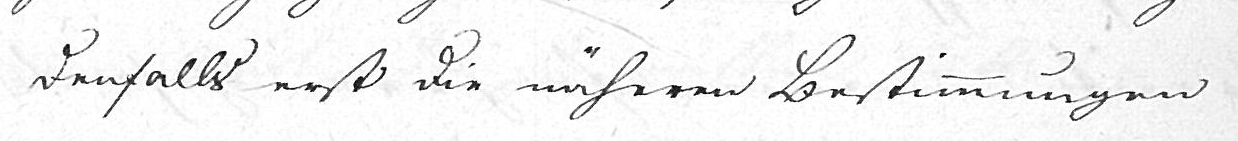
denfalls erst die näheren Bestimmungen
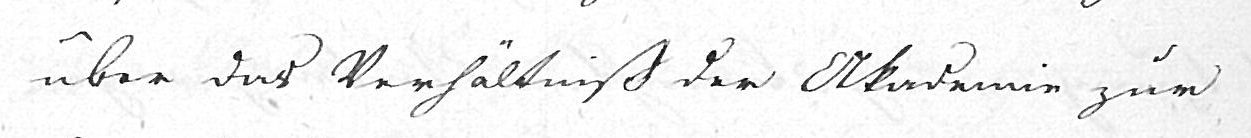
über das Verhältniß der Akademie zur
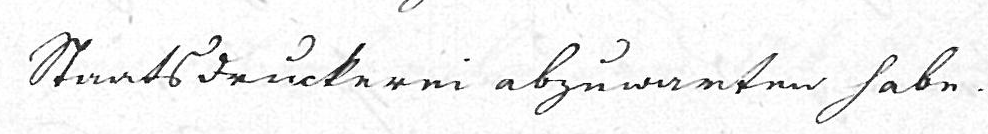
Staatsdruckerei abzuwarten habe.
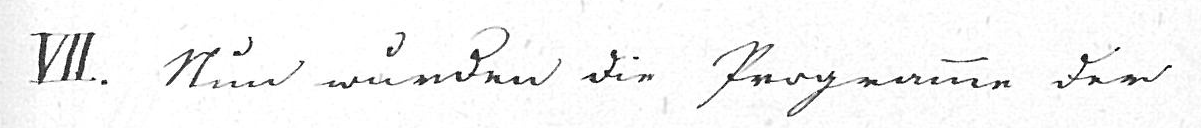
VII. Nun wurden die Programme der
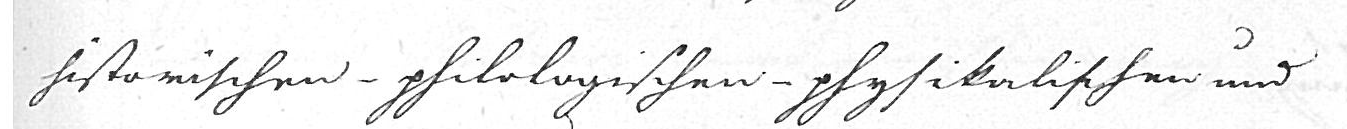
historischen-phlologischen-physikalischen und
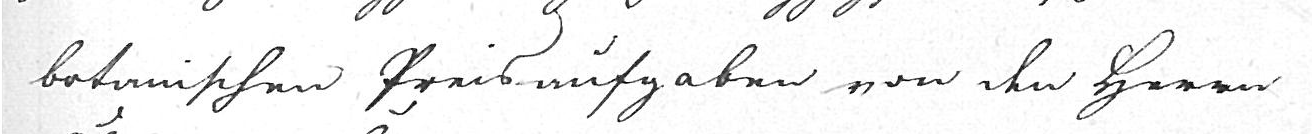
botanischen Preisaufgaben von den Herrn
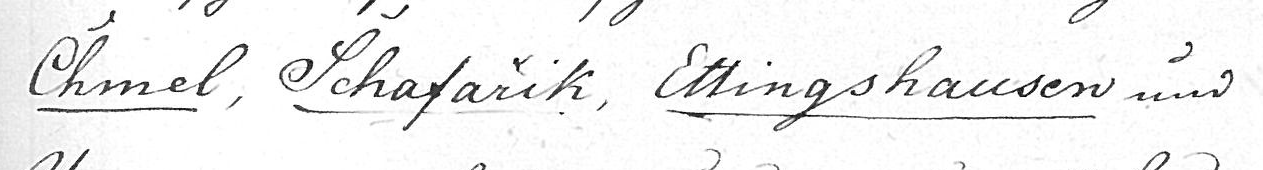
Chmel, Schafarik, Ettingshausen und
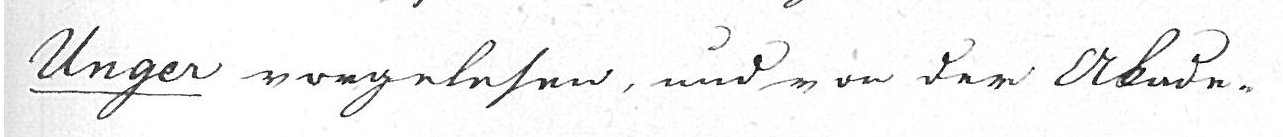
Unger vorgelesen, und von der Akade-
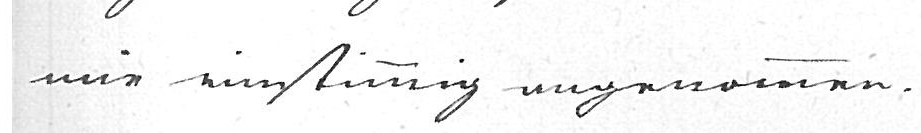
mie einstimmig angenommen.
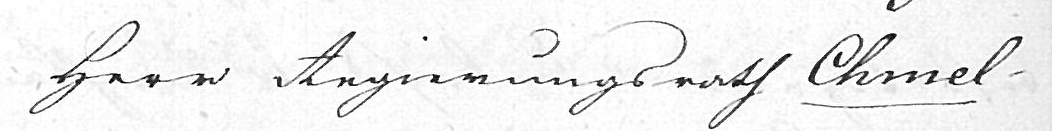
Herr Regierungsrath Chmel
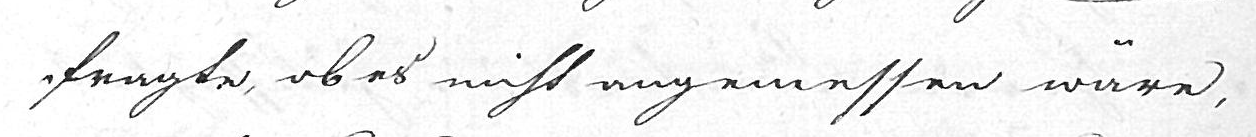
fragte, ob es nicht angmessen wäre,
